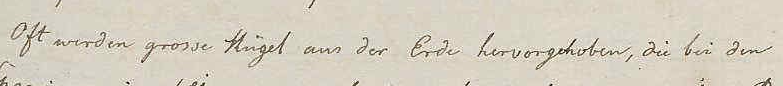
Oft werden grosse Hügel aus der Erde hervorgehoben, die bei den
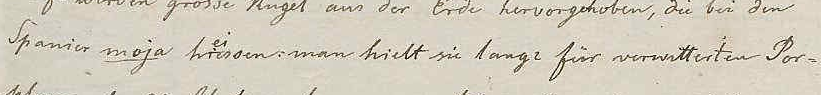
Spanier moja hieeissen: man hielt sie lange für verwitterten Por-
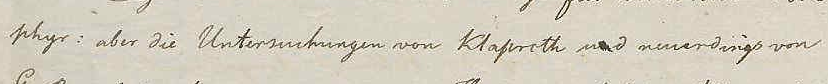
phyr: aber die Untersuchungen von Klaproth und neuerdings von
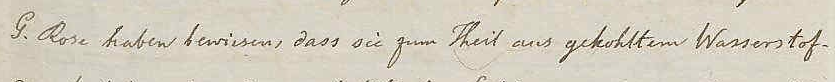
G. Rose haben bewiesen, dass sie zum Theil aus gekohltem Wasserstof-
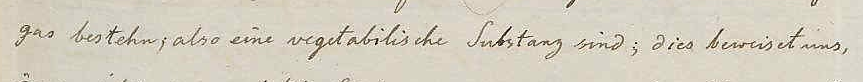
gas bestehn; also eine vegetabilische Substanz sind;: dies beweiset uns,
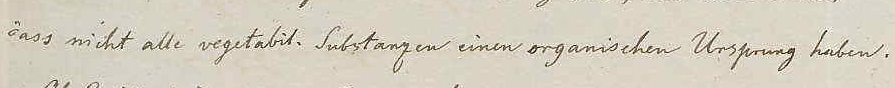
dass nicht alle vegetabil. Substanzen einen organischen Ursprung haben.
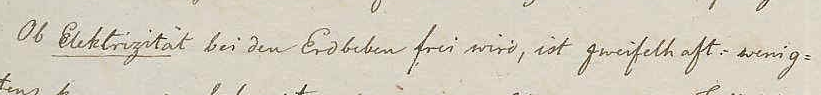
Ob Elektrizität bei den Erdbeben frei wird, ist zweifelhaft: wenig-
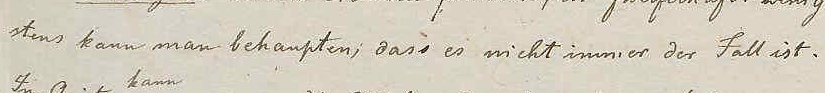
stens kann man behaupten, dass es nicht immer der Fall ist.
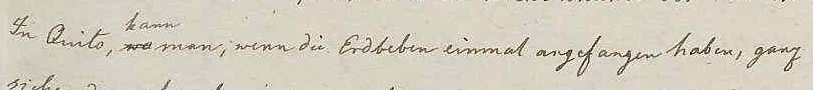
In Quito, wokann man, wenn die Erdbeben einmal angefangen haben, ganz
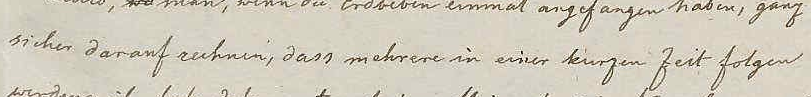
sicher darauf rechnen, dass mehrere in einer kurzen Zeit folgen
